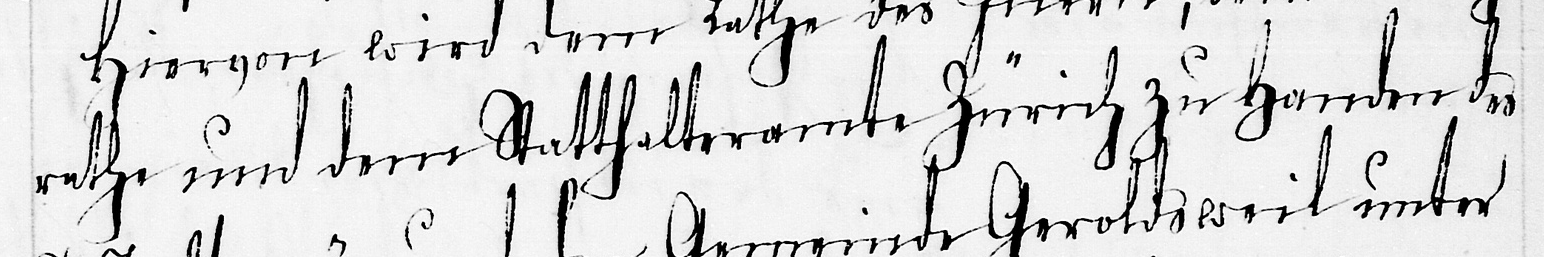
rathe und dem Statthalteramte Zürich zu Handen des
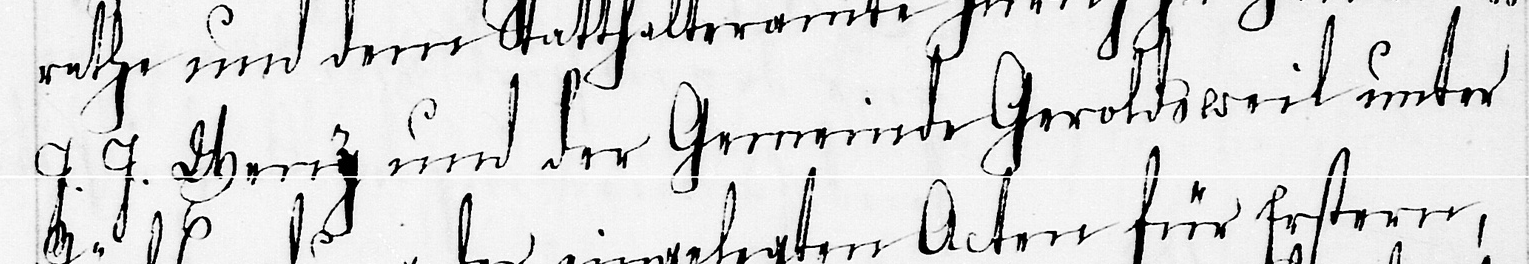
J. J. Wenz und der Gemeinde Geroldsweil unter
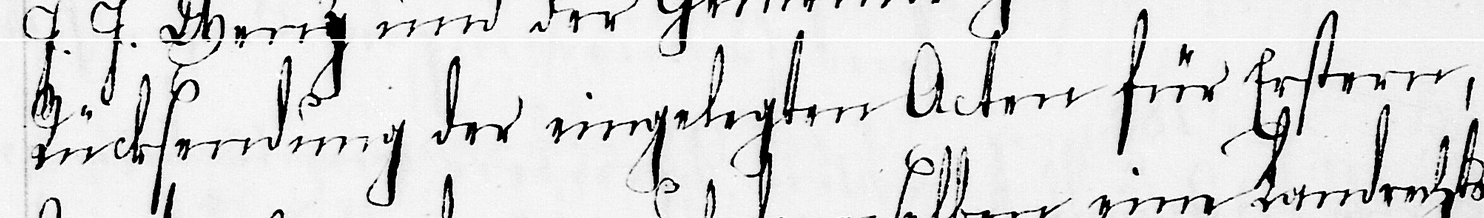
Rücksendung der eingelegten Acten für Erstern,
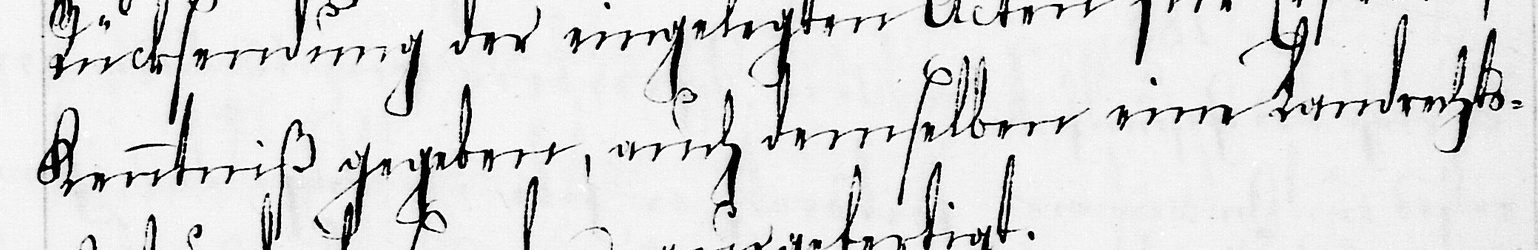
Kenntniß gegeben, auch demselben eine Landrechts¬
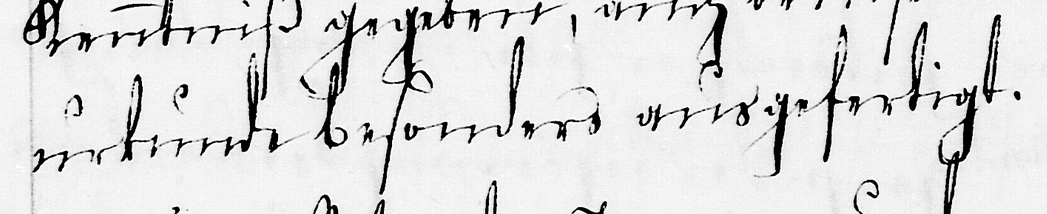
urkunde besonders ausgefertigt.
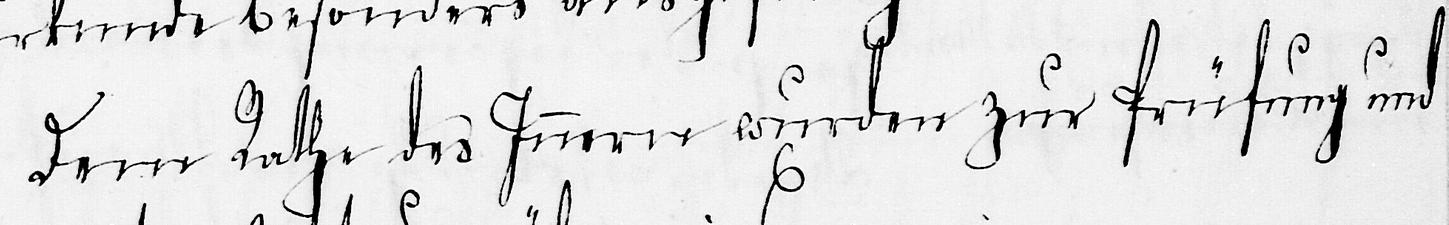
Dem Rathe des Innern wurden zur Prüfung und
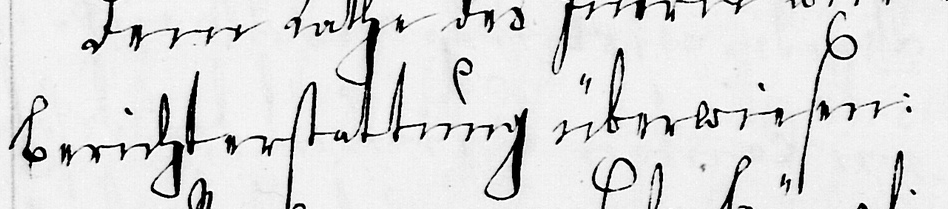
Berichterstattung überwiesen:
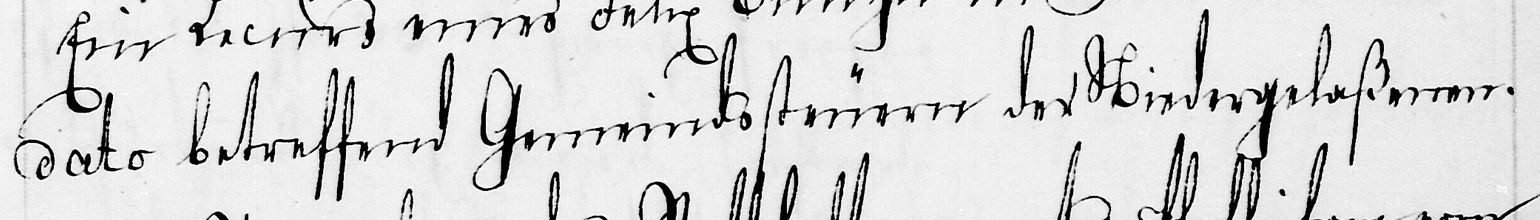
dato betreffend Gemeindssteuern der Niedergelaßenen.
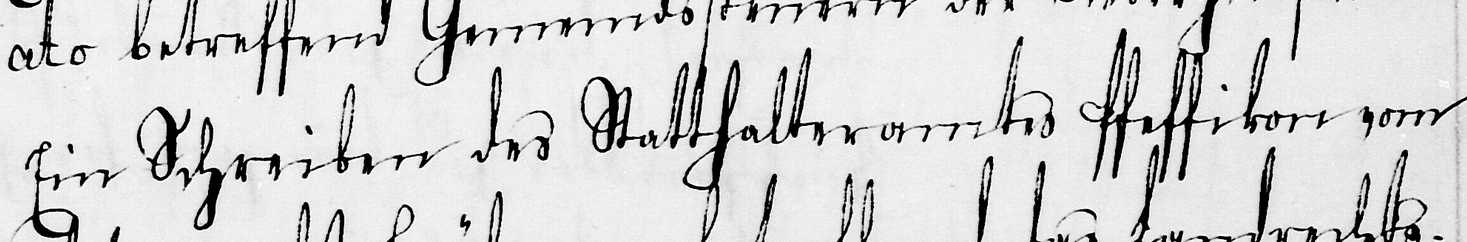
Ein Schreiben des Statthalteramtes Pfeffikon vom
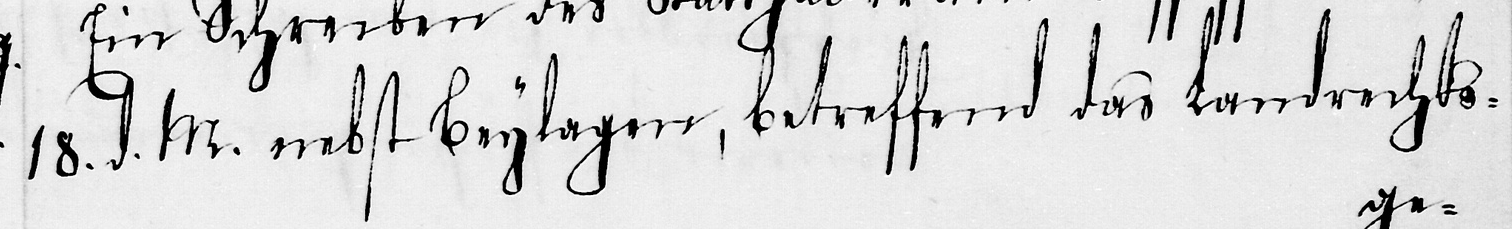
18. d. M. nebst Beylagen, betreffend das Landrechts-
